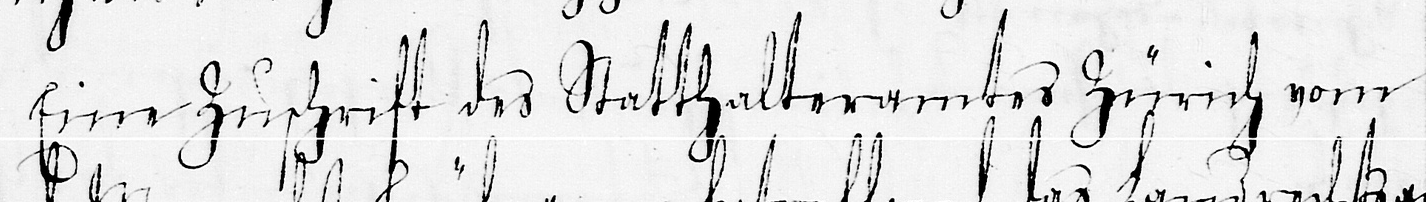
Eine Zuschrift des Statthalteramtes Zürich vom
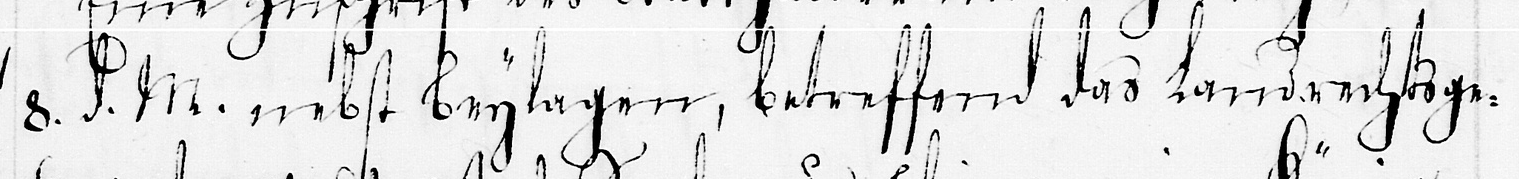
8. d. M. nebst Beylagen, betreffend das Landrechtsge¬
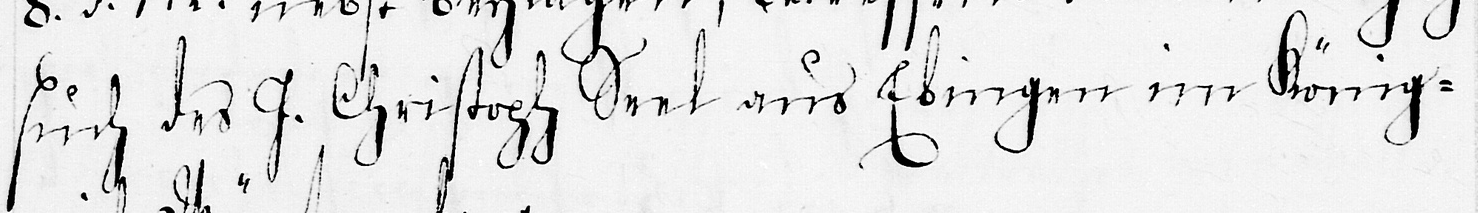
such des J. Christoph Seel aus Ebingen im König¬
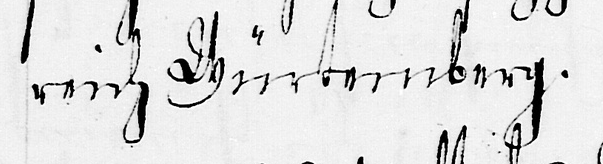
reich Würtemberg.
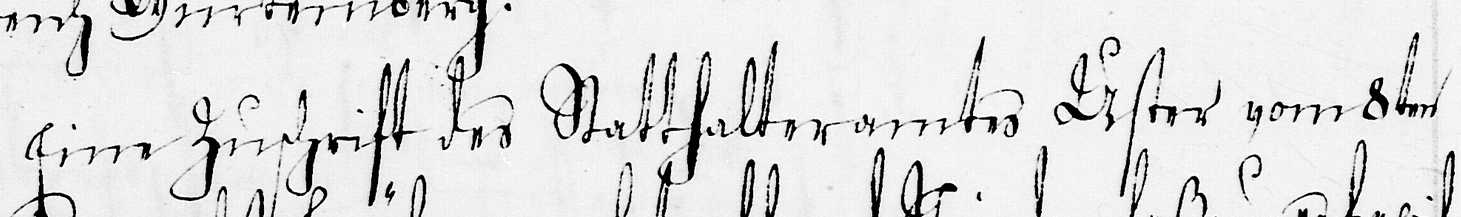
Eine Zuschrift des Statthalteramtes Uster vom 8ten
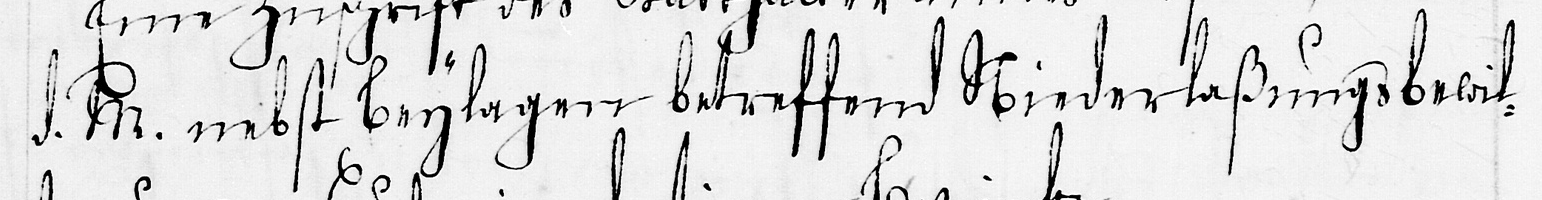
d. M. nebst Beylagen betreffend Niederlaßungsbewil¬
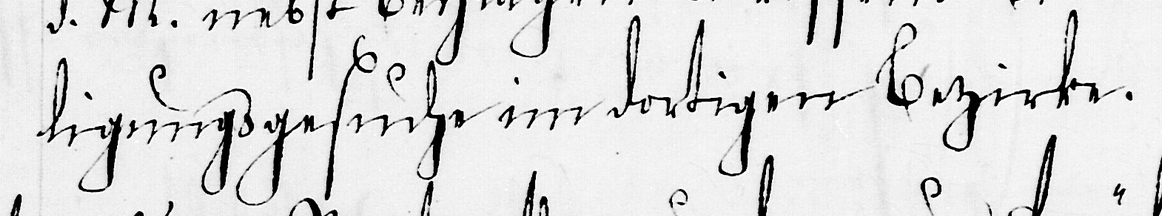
ligungsgesuche im dortigen Bezirke.
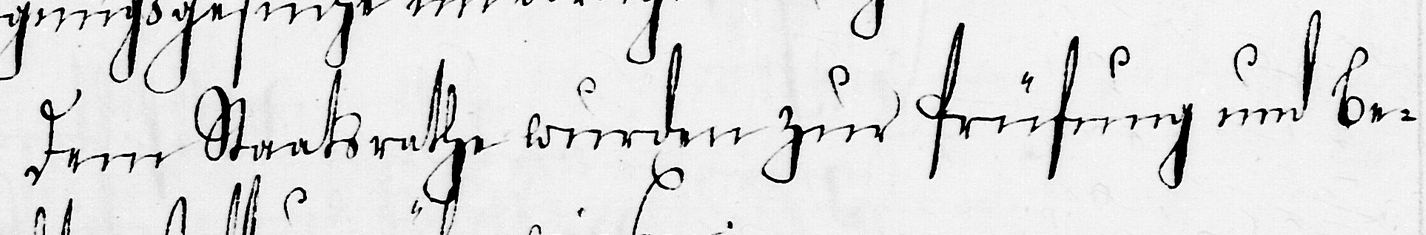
Dem Staatsrathe wurden zur Prüfung und Be¬
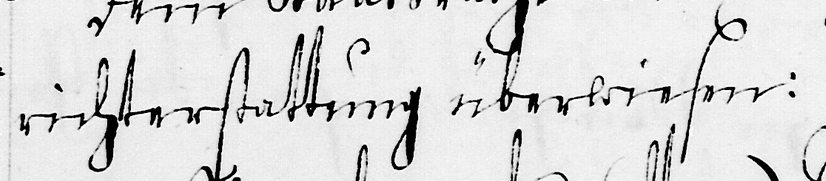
richterstattung überwiesen:
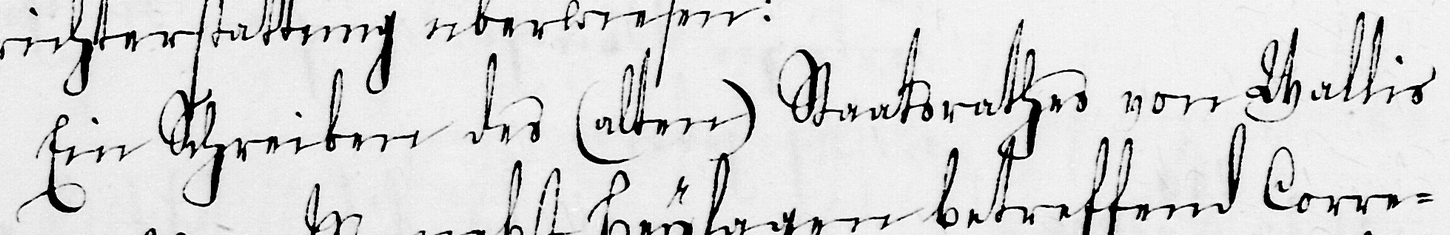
Ein Schreiben des (alten) Staatsrathes von Wallis
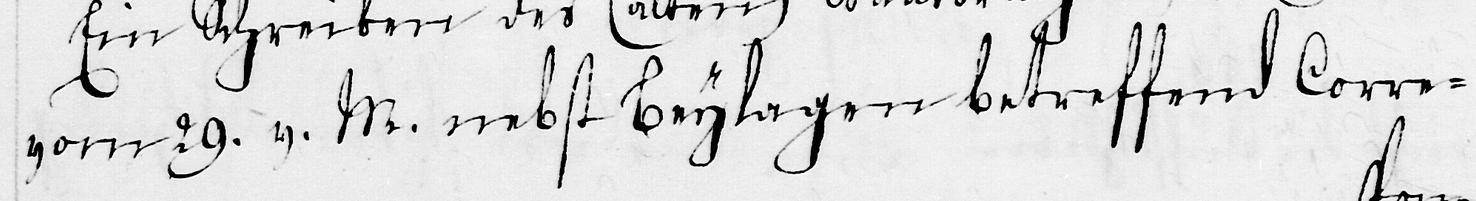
vom 29. v. M. nebst Beylagen betreffend Corre-
